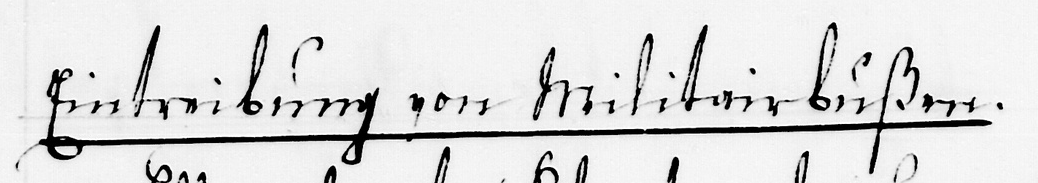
Eintreibung von Militairbußen.
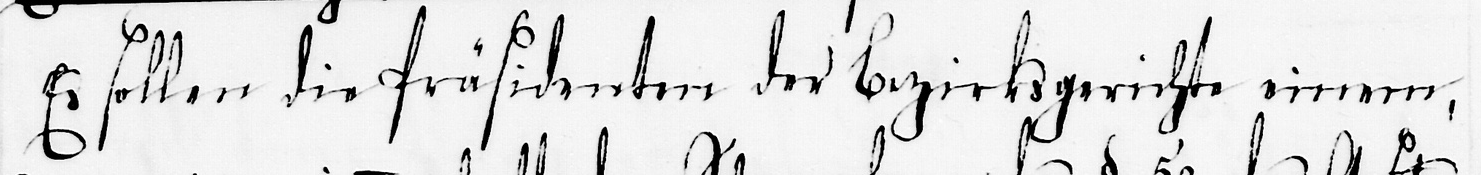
Es sollen die Präsidenten der Bezirksgerichte einem,
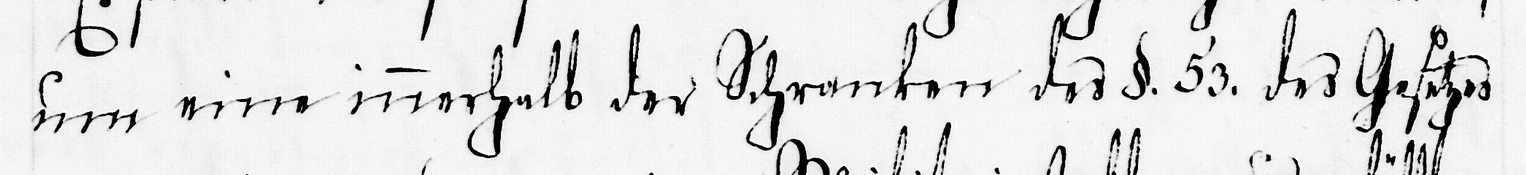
um eine innerhalb der Schranken des §. 53. des Gesetzes
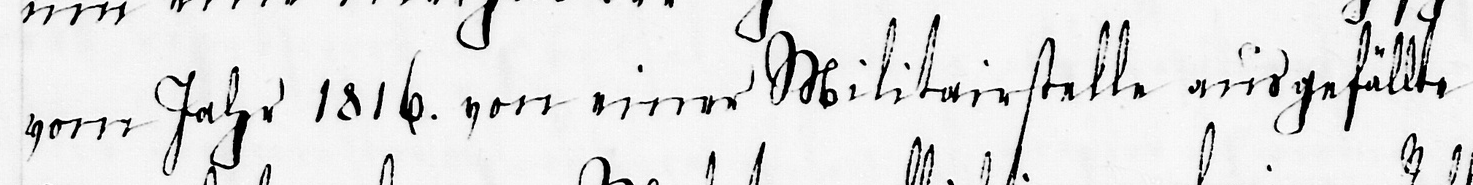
vom Jahr 1816. von einer Militairstelle ausgefällte
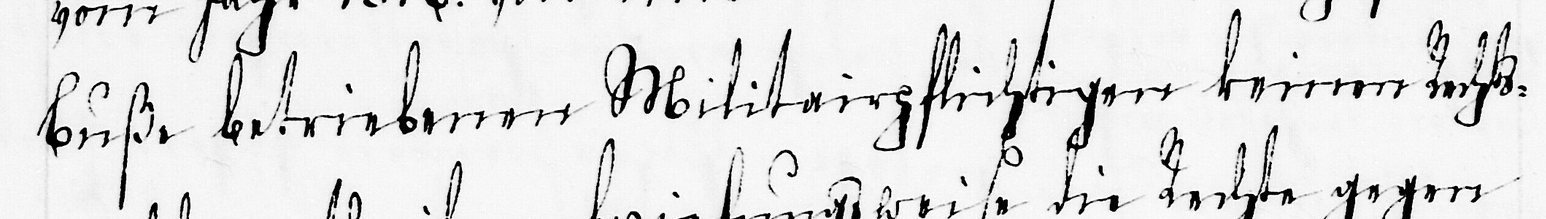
Buße betriebenen Militairpflichtigen keinen Rechts¬
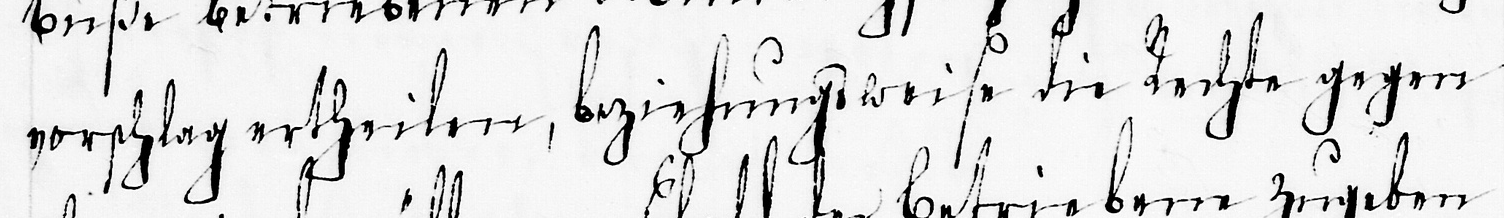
vorschlag ertheilen, beziehungsweise die Rechte gegen
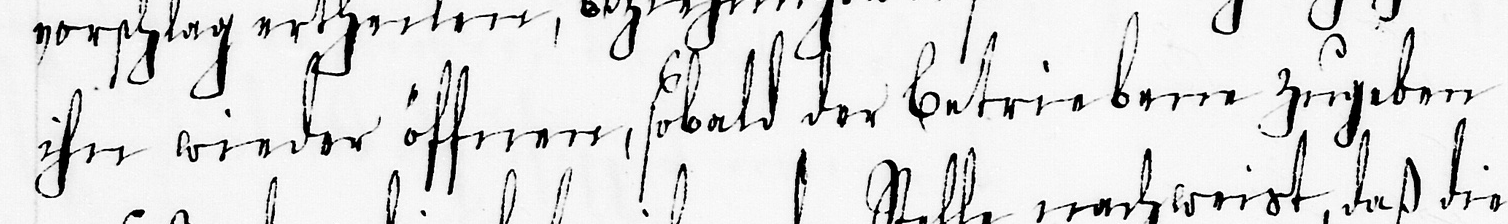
ihn wieder öffnen, sobald der Betriebene zugeben
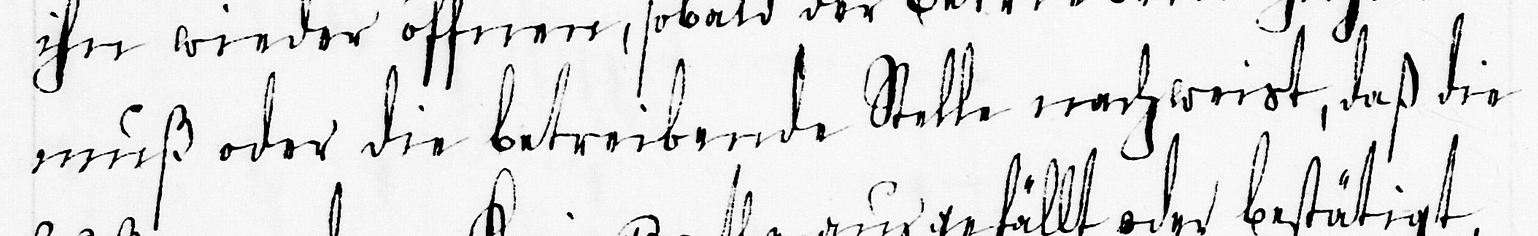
muß oder die betreibende Stelle nachweist, daß die
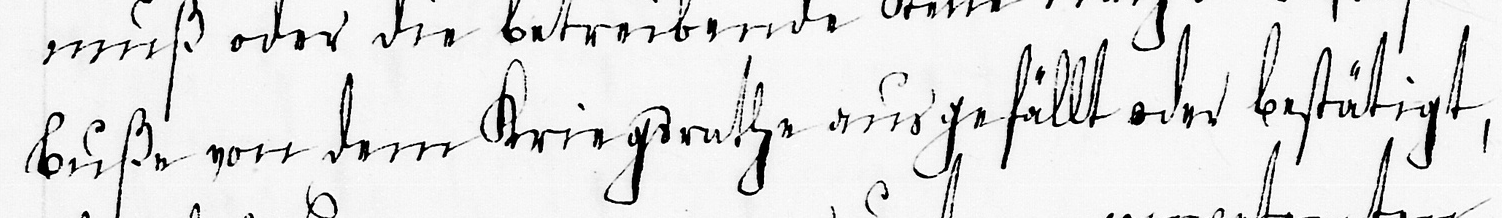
Buße von dem Kriegsrathe ausgefällt oder bestätigt,
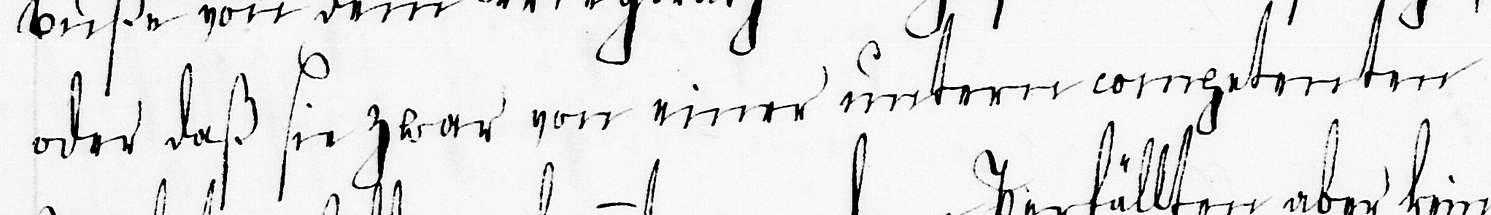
oder daß sie zwar von einer untern competenten
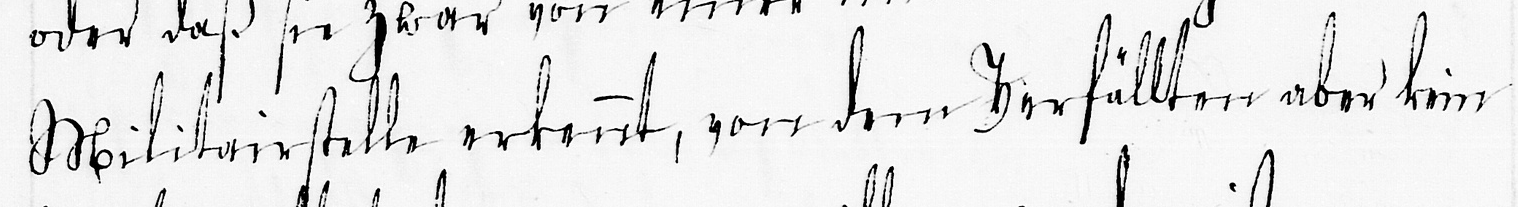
Militairstelle erkennt, von dem Verfällten aber kein
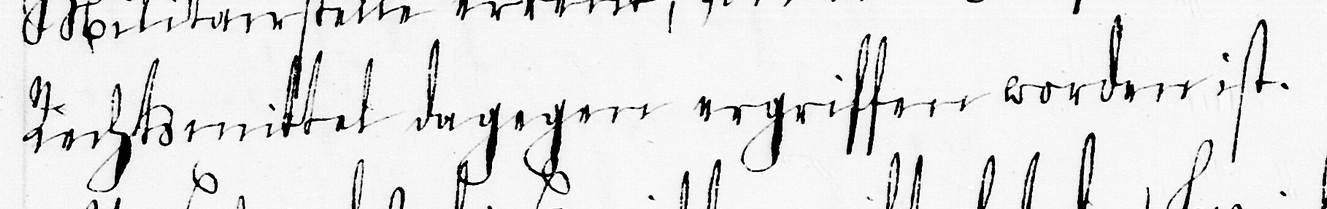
Rechtsmittel dagegen ergriffen worden ist.
